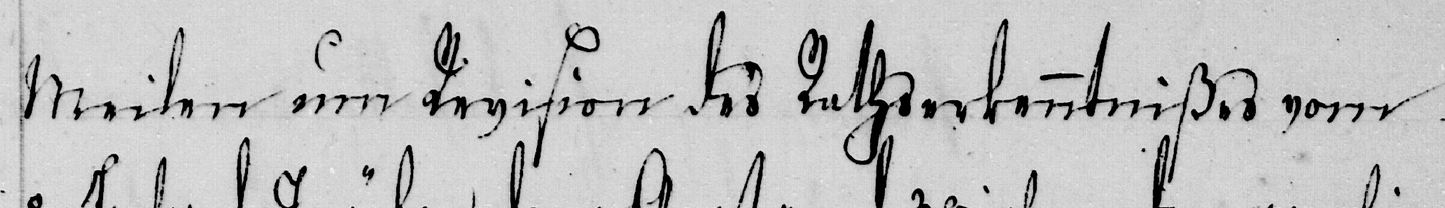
Meilen um Revision des Rathserkenntnißes vom
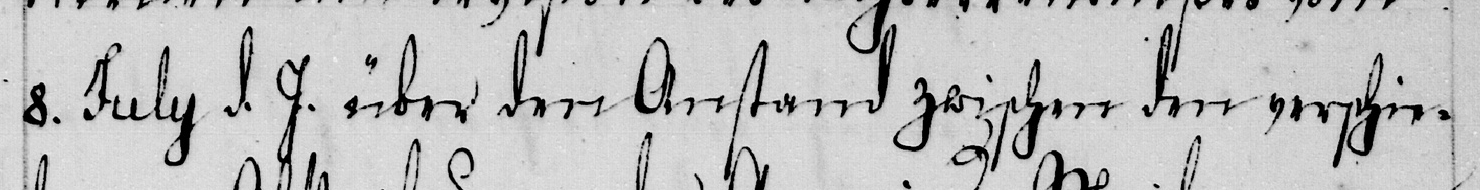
8. July d. J. über den Anstand zwischen den verschie¬
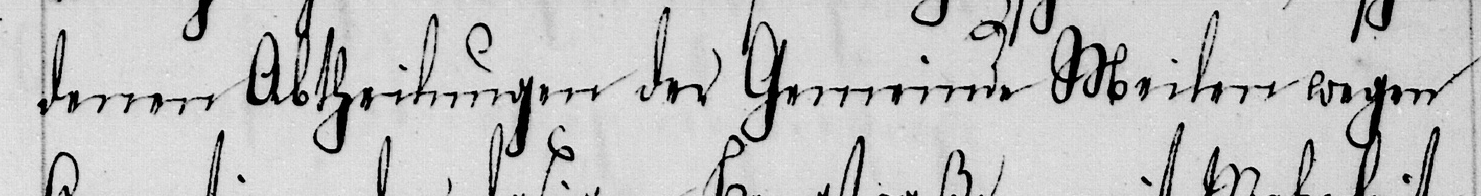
denen Abtheilungen der Gemeinde Meilen wegen
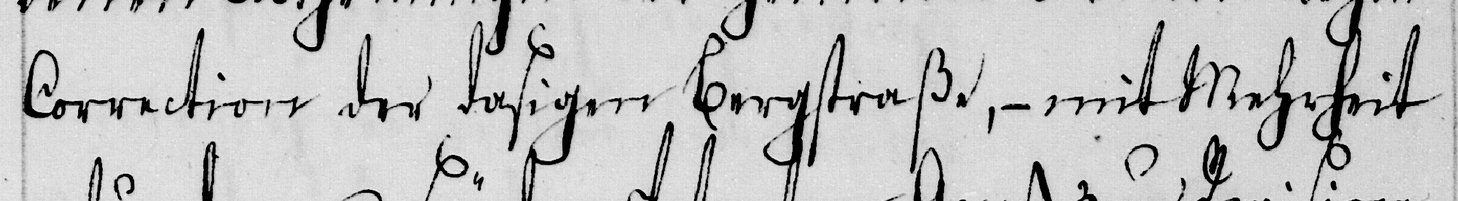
Correction der dasigen Bergstraße, – mit Mehrheit
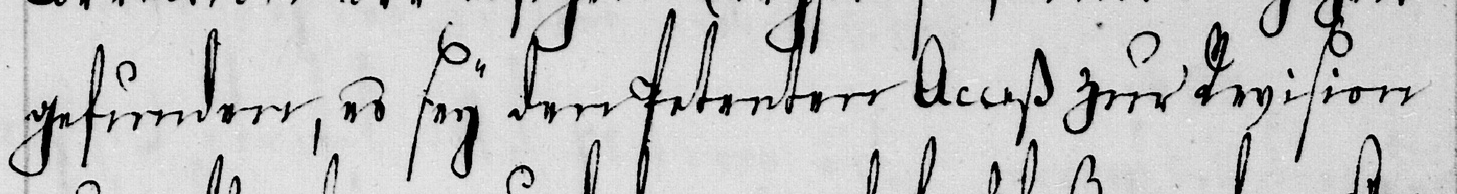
gefunden, es sey den Petenten Acceß zur Revision
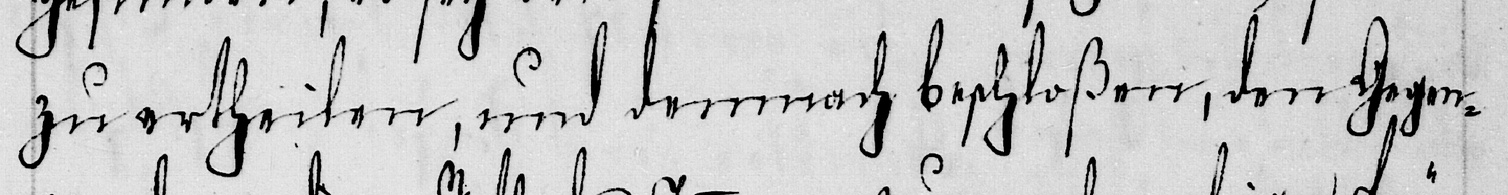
zu ertheilen, und demnach beschloßen, den Gegen¬
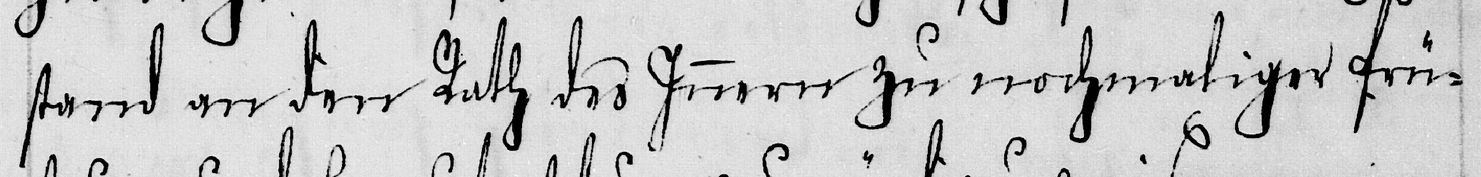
stand an den Rath des Innern zu nochmaliger Prü¬
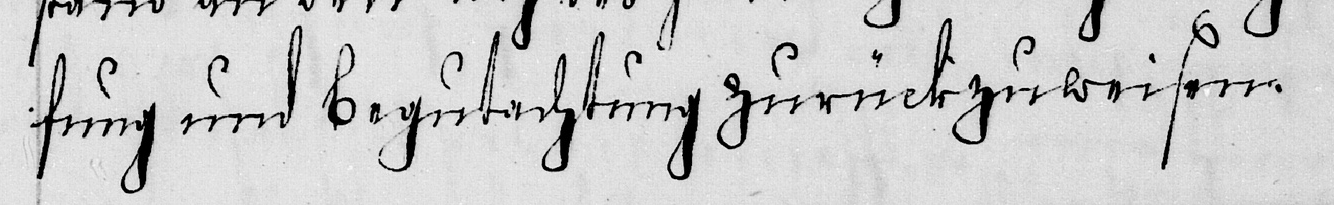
fung und Begutachtung zurückzuweisen.
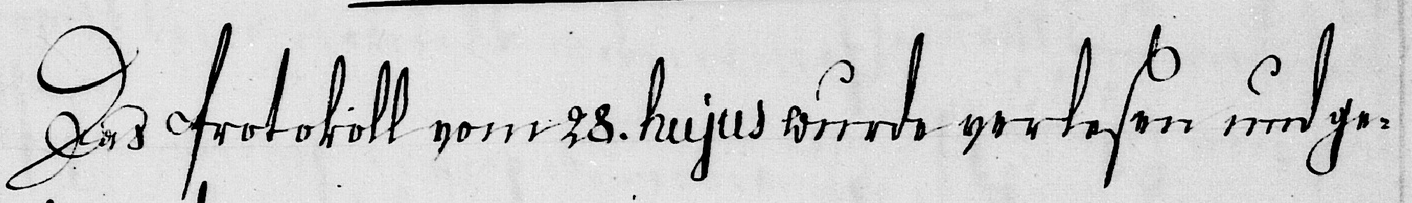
Das Protokoll vom 28. hujus wurde verlesen und ge¬
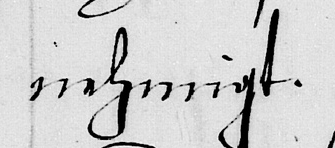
nehmigt.
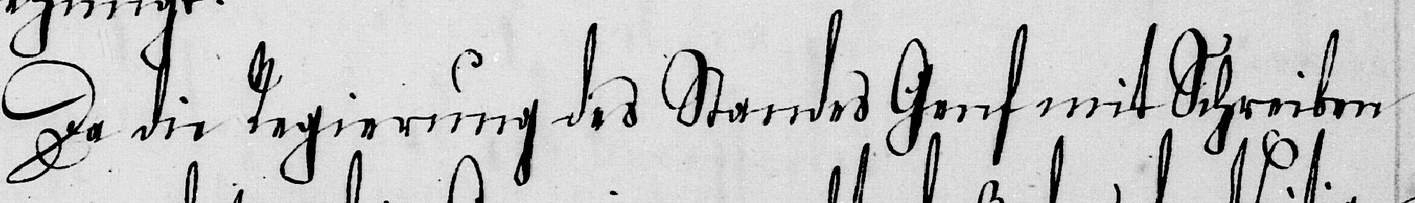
Da die Regierung des Standes Genf mit Schreiben
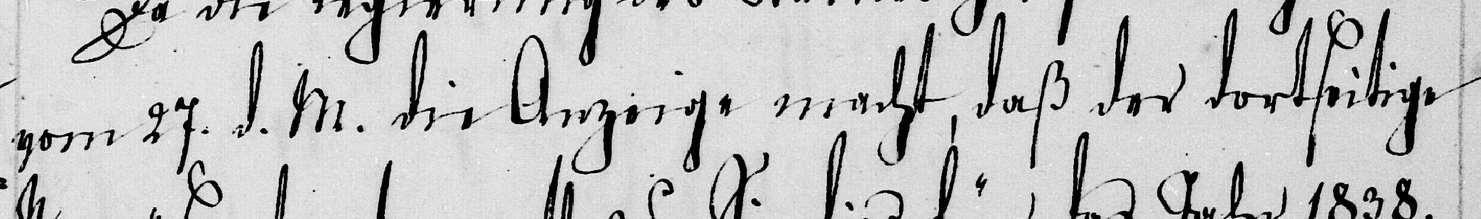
vom 27. d. M. die Anzeige macht, daß der dortseitige
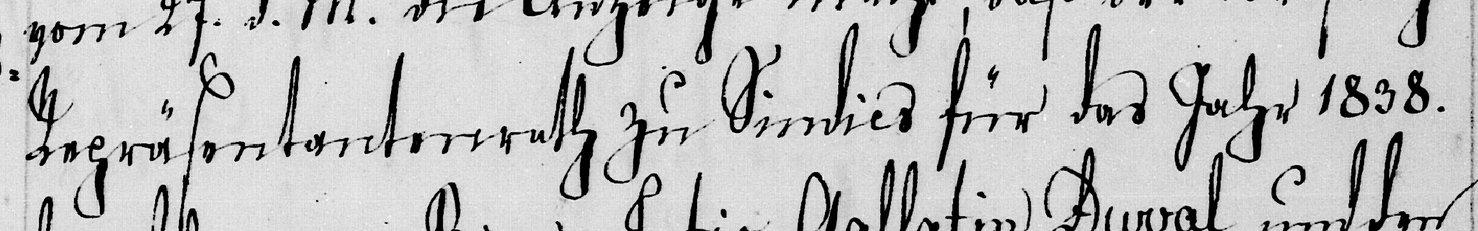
Repräsentantenrath zu Sindics für das Jahr 1838.
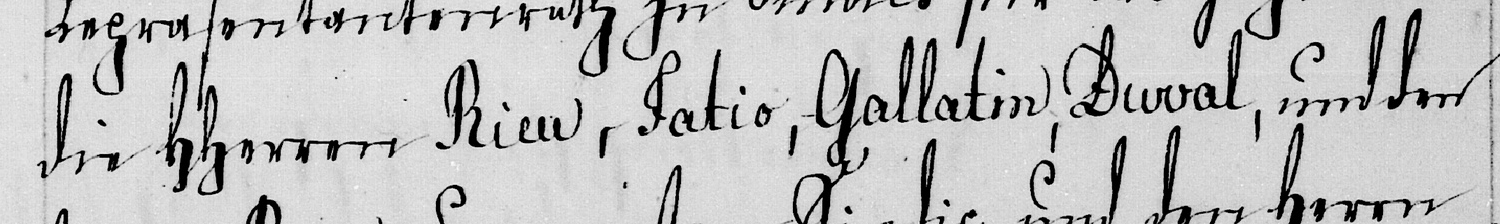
die HHerrn Rieu, Fatio, Gallatin, Duval, und den
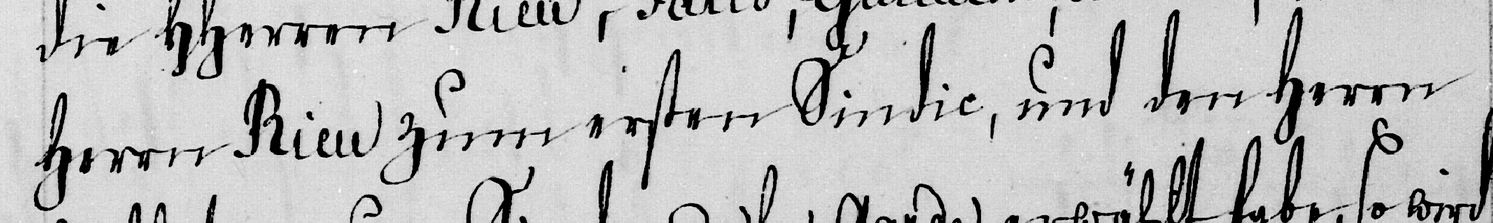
Herrn Rieu zum ersten Sindic, und den Herrn
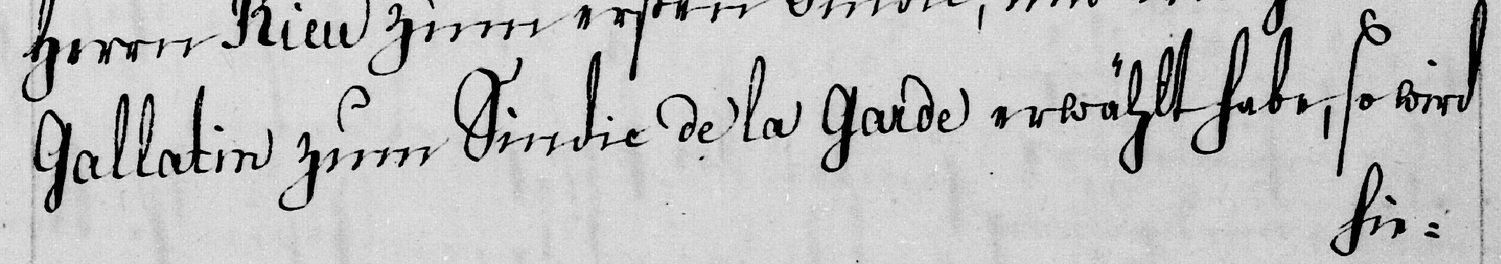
Gallatin zum Sindic de la Garde erwählt habe, so wird
